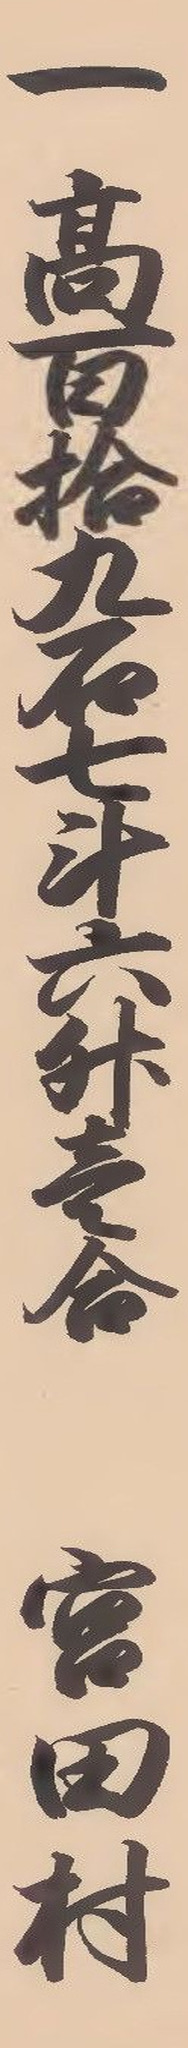一高百拾九石七斗六升壱合宮田村
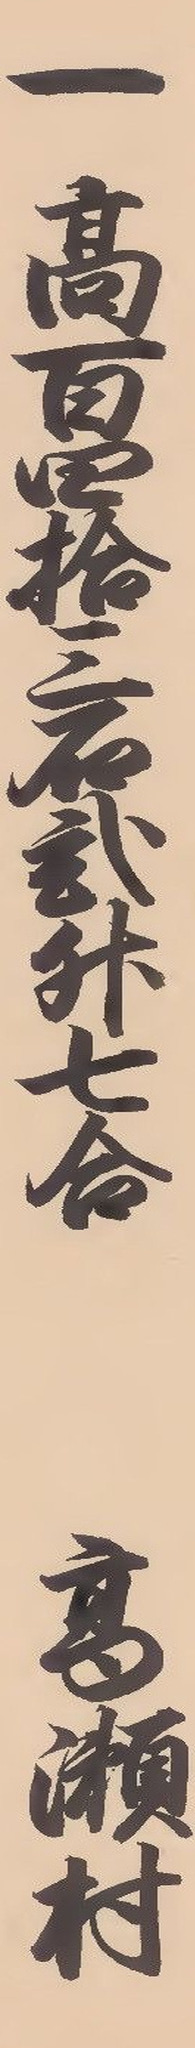一高百四拾三石弐升七合高瀬村
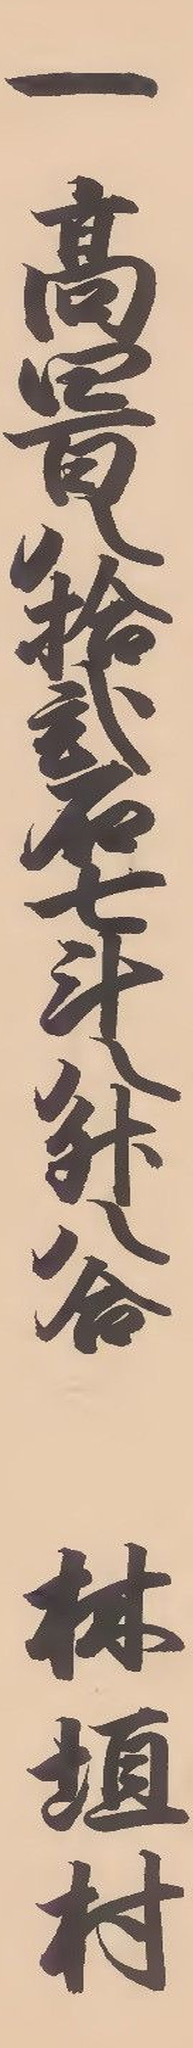一高四百八拾弐石七斗八升八合林垣村

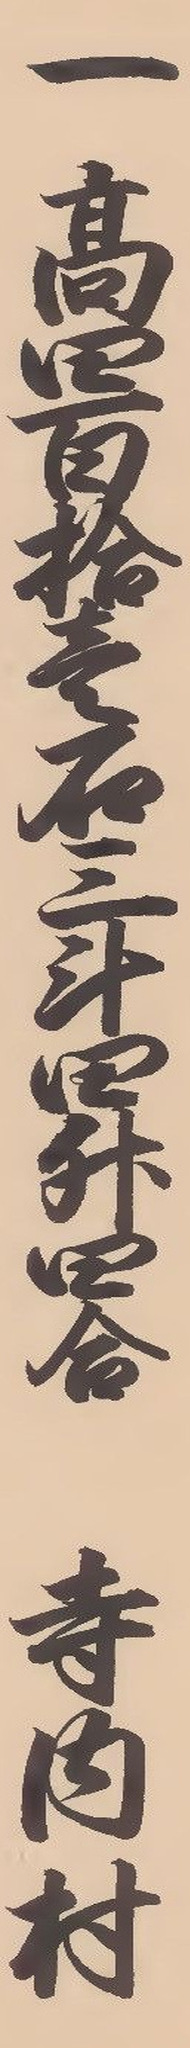一高四百拾壱石三斗四升四合寺内村
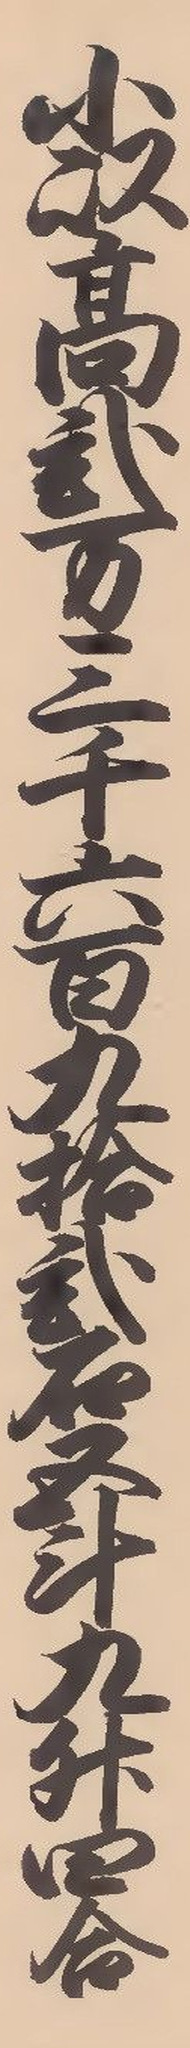小以高弐万三千六百九拾弐石五斗九升四合
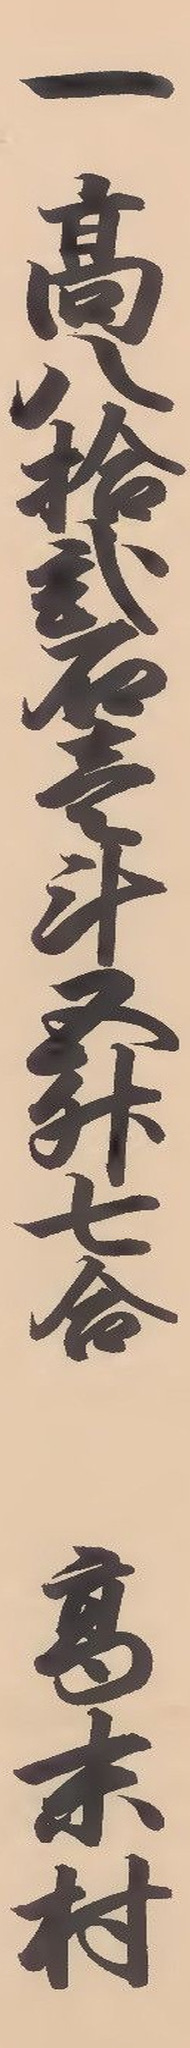一高八拾弐石壱斗五升七合高木村
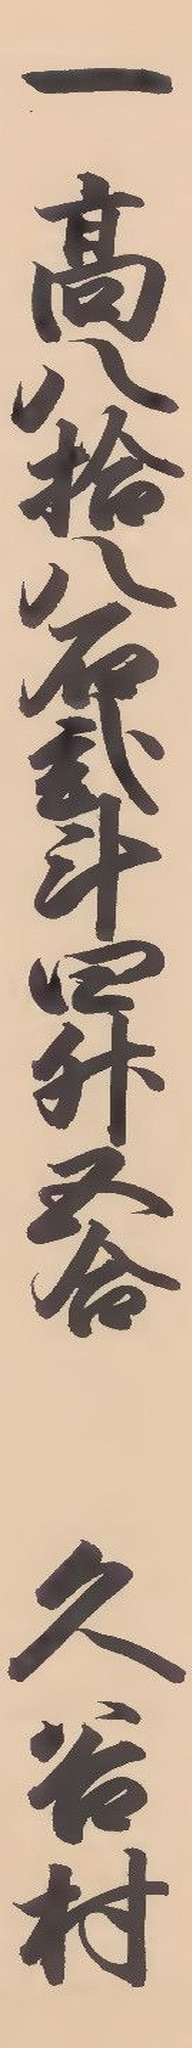一高八拾八石弐斗四升五合九谷村
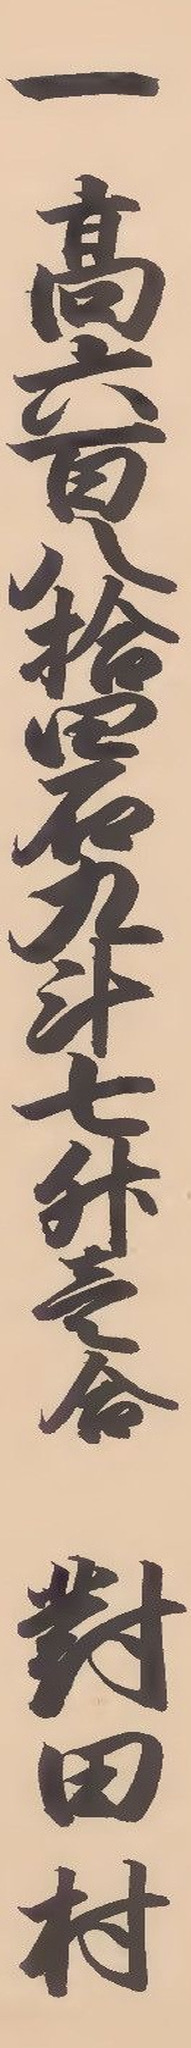一高六百八拾四石九斗七升壱合対田村

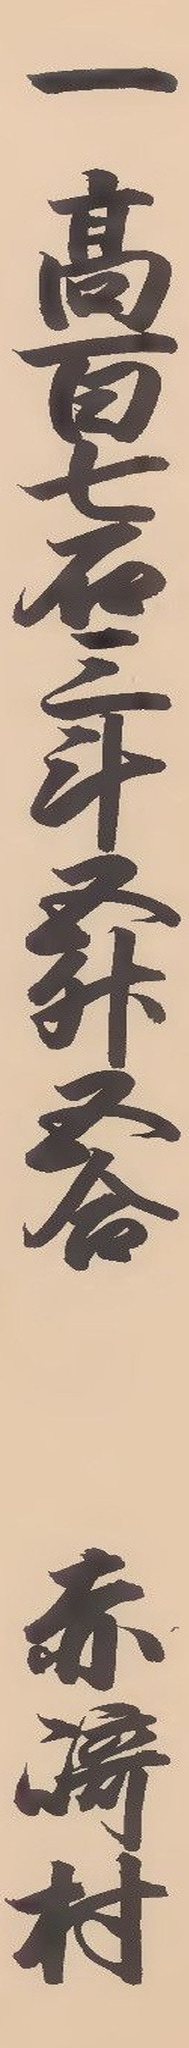一高百七石三斗五升五合赤崎村
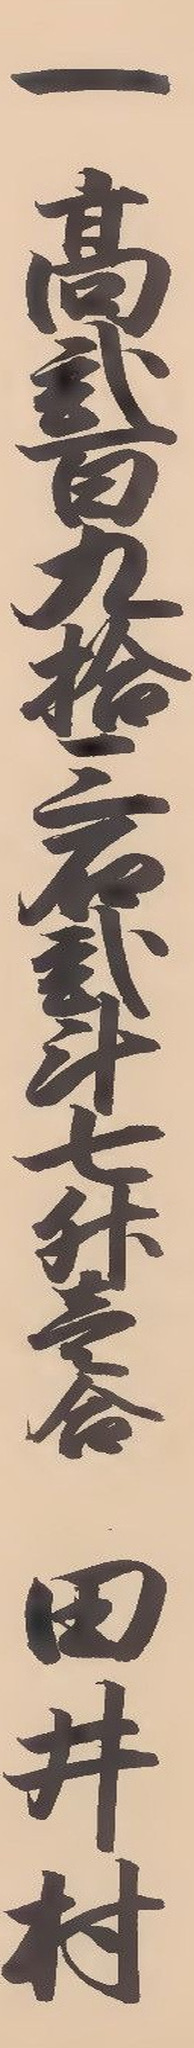一高弐百九拾三石弐斗七升壱合田井村
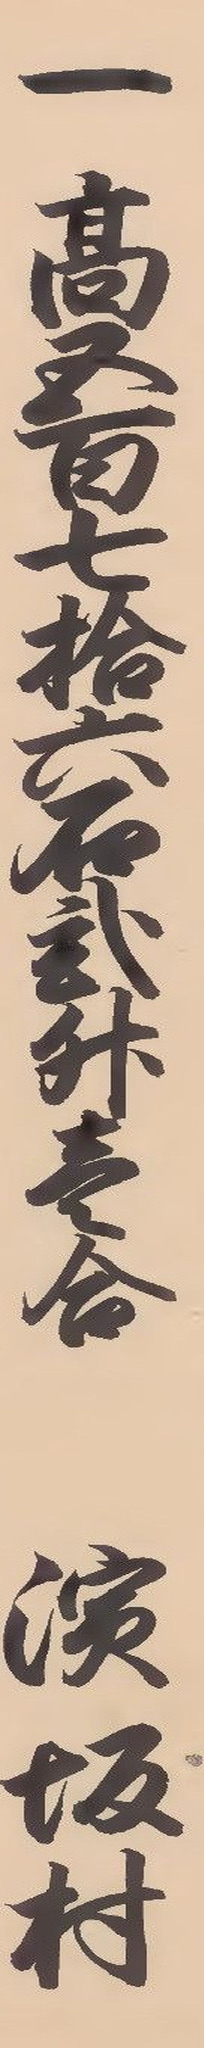一高五百七拾六石弐升壱合浜坂村
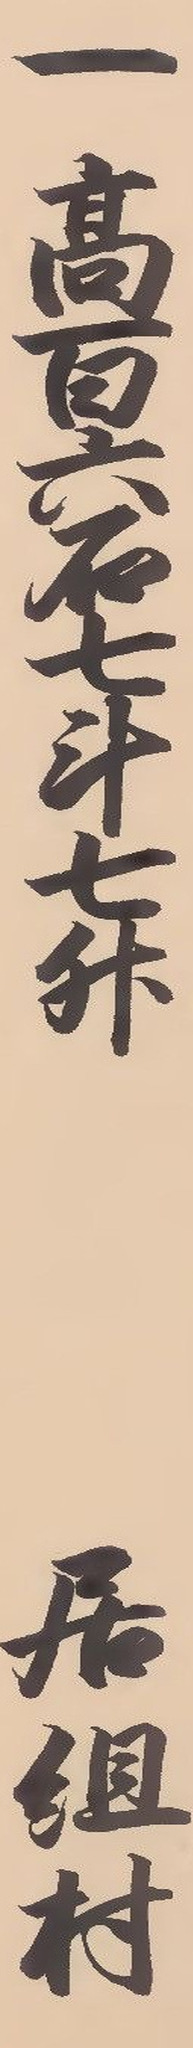一高百六石七斗七升居組村
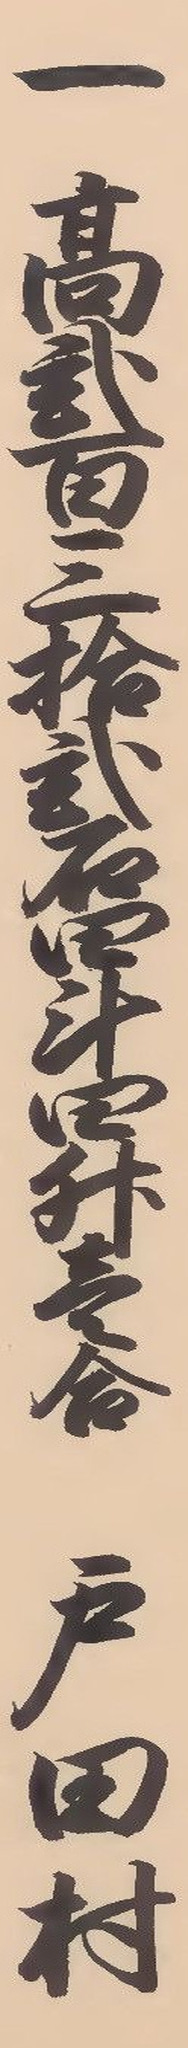一高弐百三拾弐石四斗四升壱合戸田村
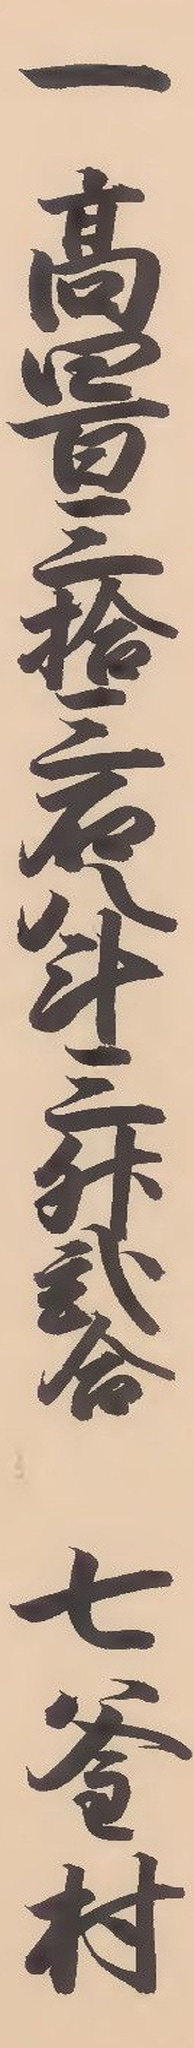一高四百三拾三石八斗三升弐合七釜村
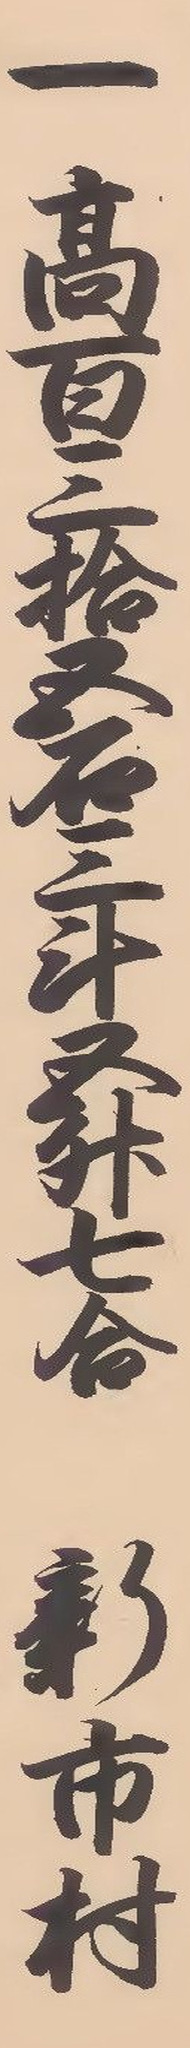一高百三拾五石三斗五升七合新市村

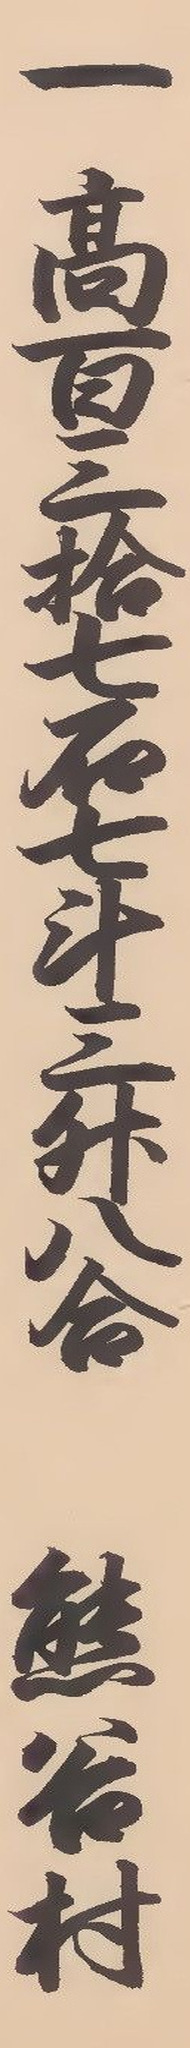一高百三拾七石七斗三升八合熊谷村
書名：但馬国郷帳
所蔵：国立公文書館 National Archives of Japan
